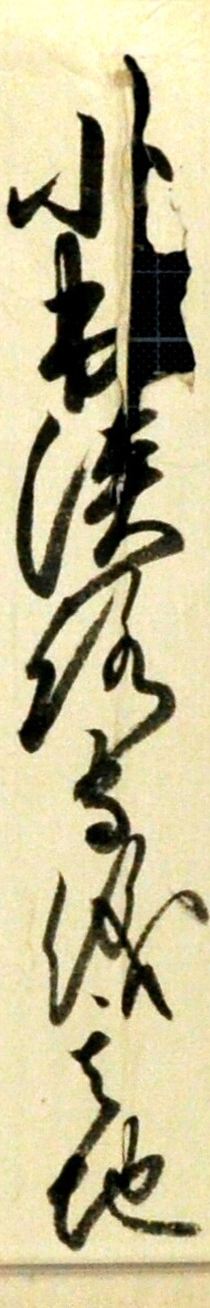小出淡路守儀其地
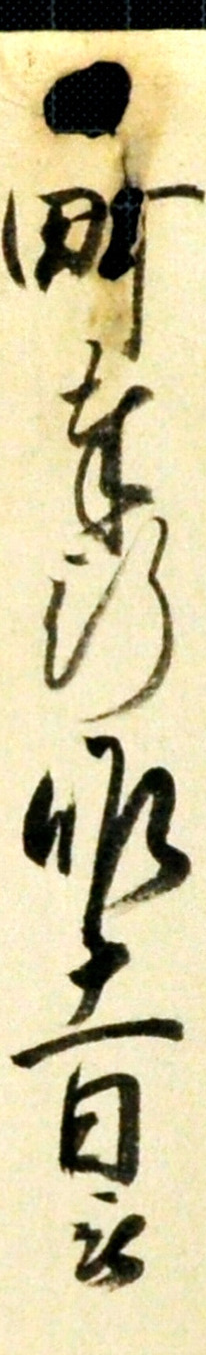町奉行昨十一日被
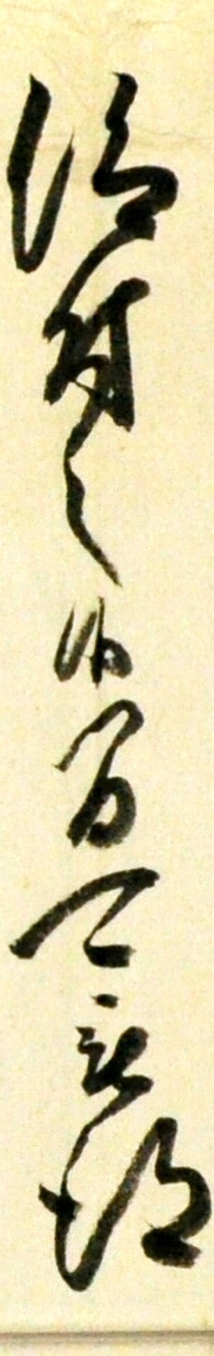仰付之候間可被得
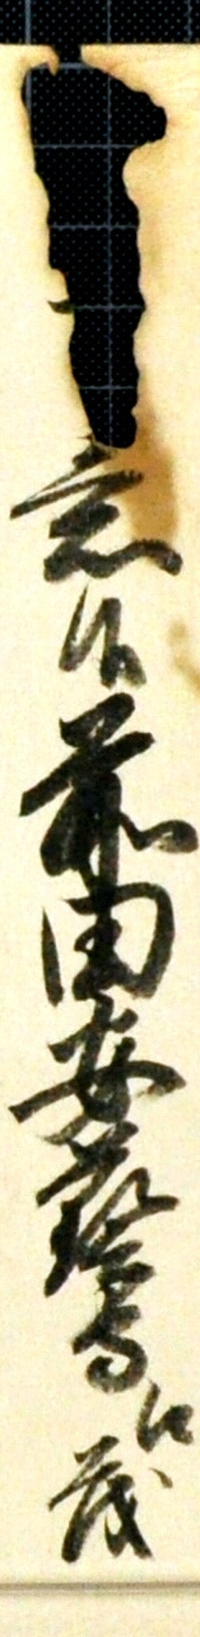意前田安芸守えも
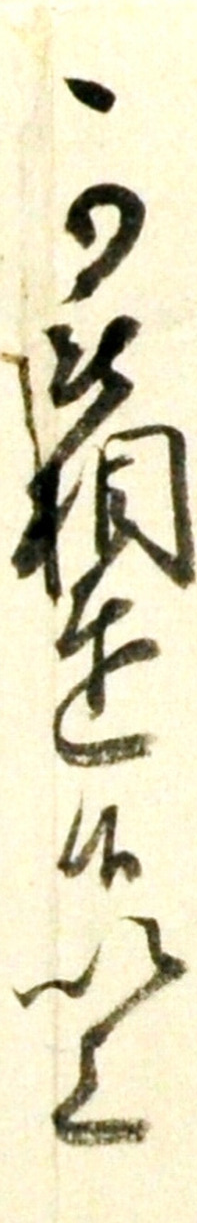可被相達候以上
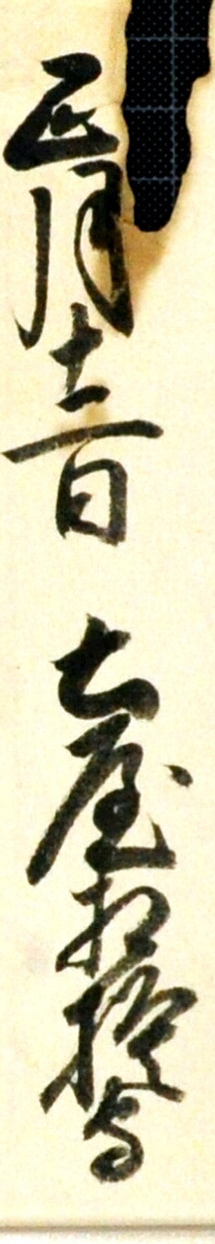正月十二日土屋相模守
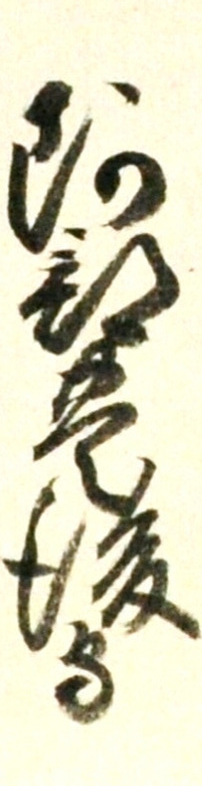阿部豊後守
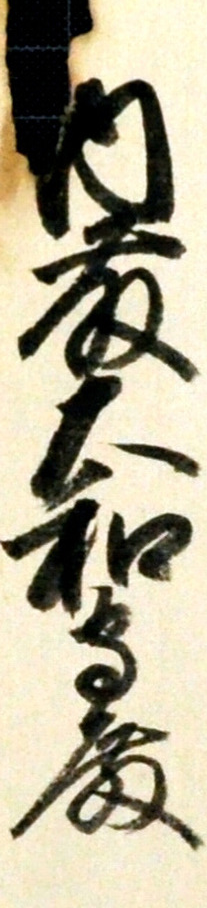内藤大和守殿
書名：書状
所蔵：伊那市立高遠町図書館・合同会社AMANE
